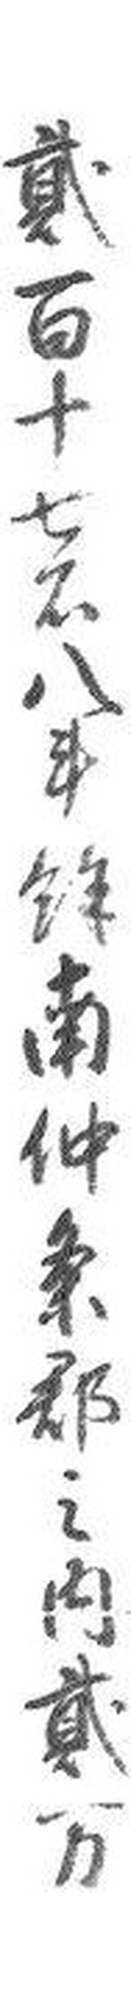弐百十七石八斗余南仲条郡之内弐万
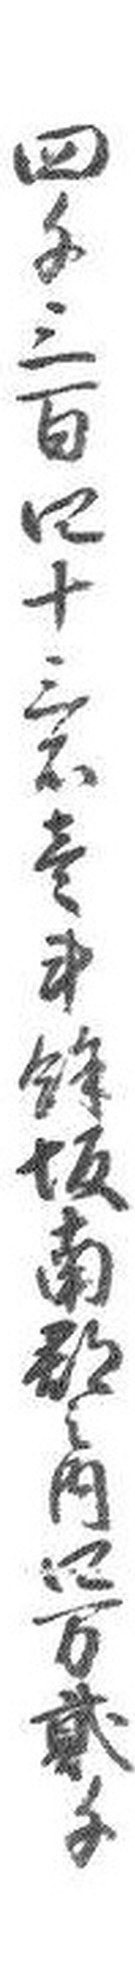四千三百四十三石壱斗余坂南郡之内四万弐千
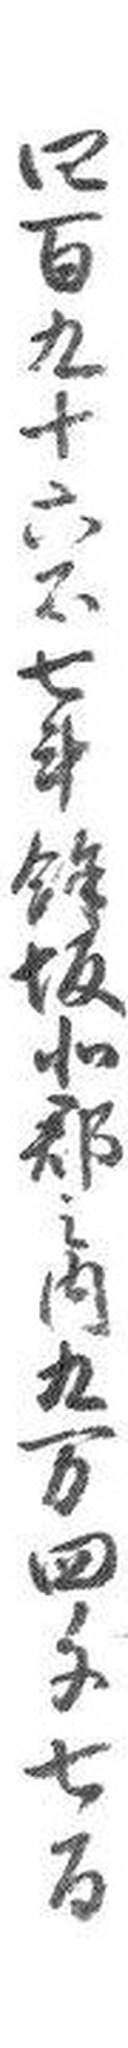四百九十六石七斗余坂北郡之内九万四千七百
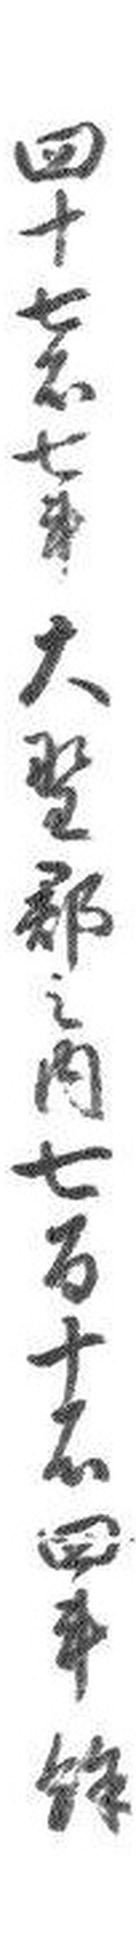四十七石七斗大野郡之内七百十石四斗余
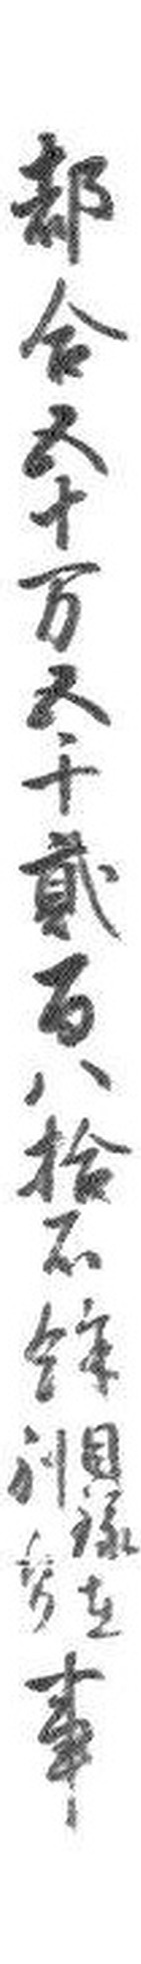都合五十万五千弐百八拾石余目録在別替事
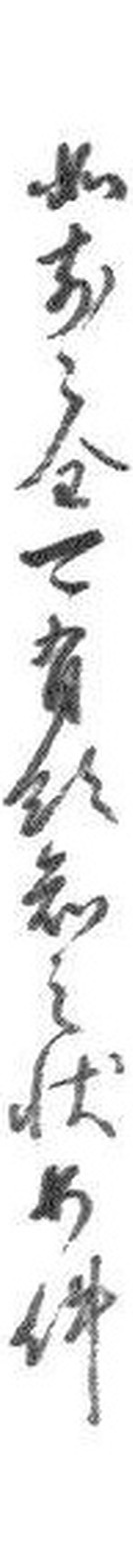如前々全可有領知之状如件
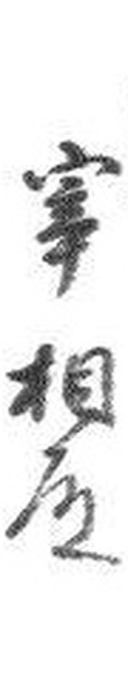宰相殿
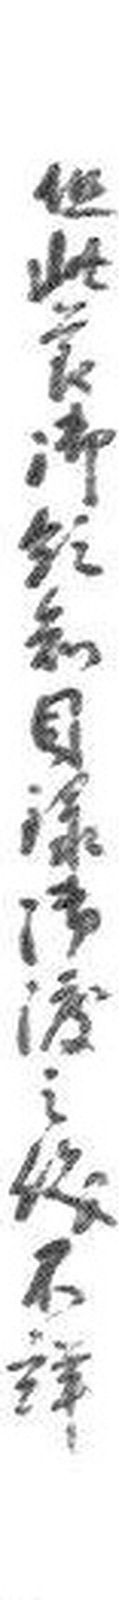但此節御領知目録御渡之儀不詳
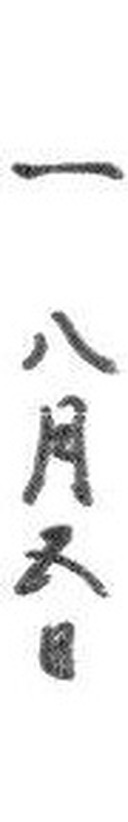一八月五日
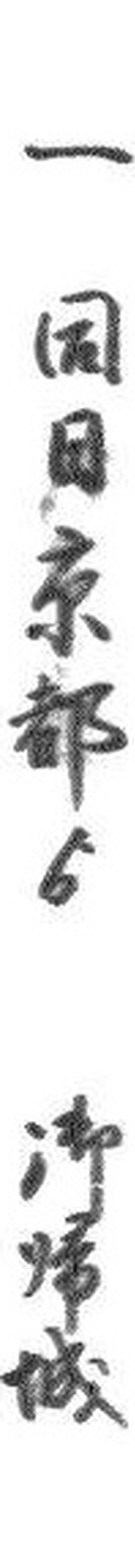一同日京都ゟ御帰城
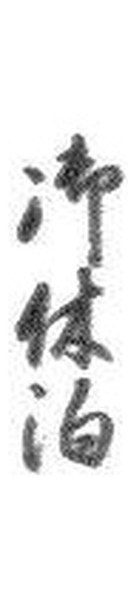御休泊

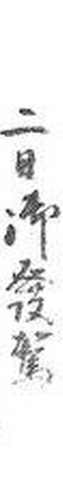二日御発駕
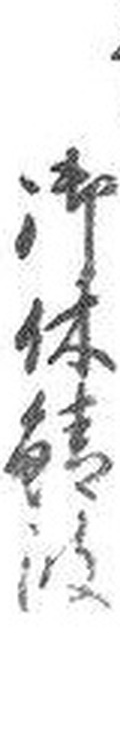御休鯖波
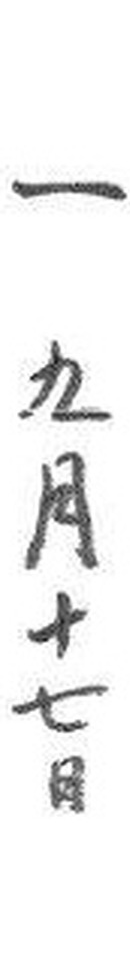一九月十七日
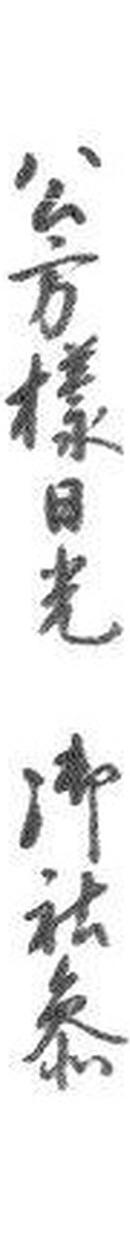公方様日光御社参
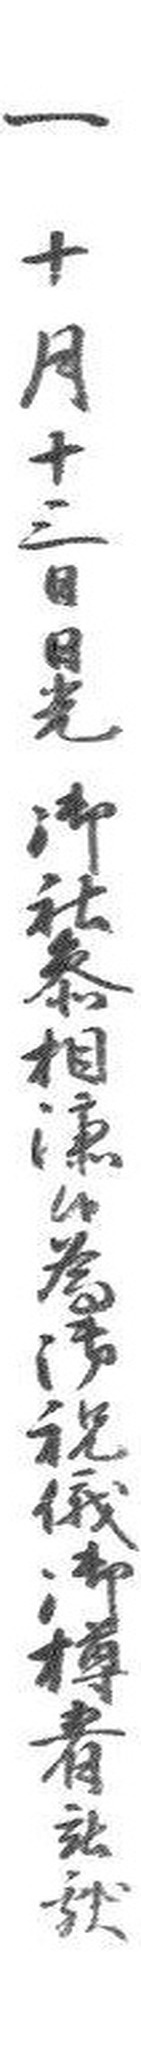一十月十三日日光御社参相済候為御祝儀御樽肴被献
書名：家譜 四 忠昌公 従寛永七年到正保四年
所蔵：福井県文書館 Fukui Prefectural Archives
